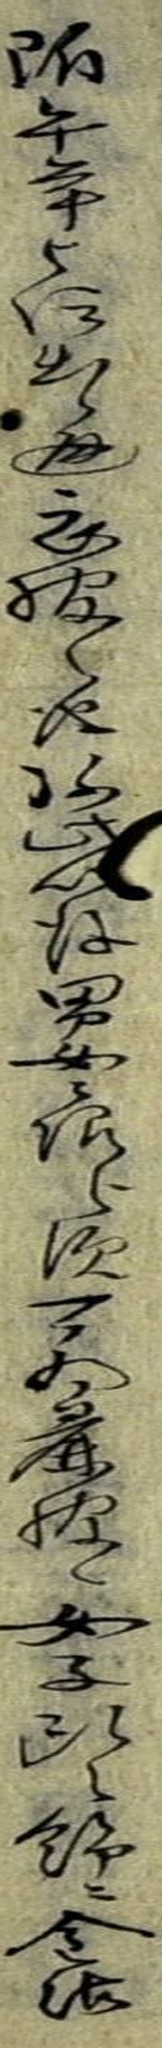附午年被仰出候通衣服之儀弥此以後男女ニ限らす可為麁服候女子頭之飾ニ金銀
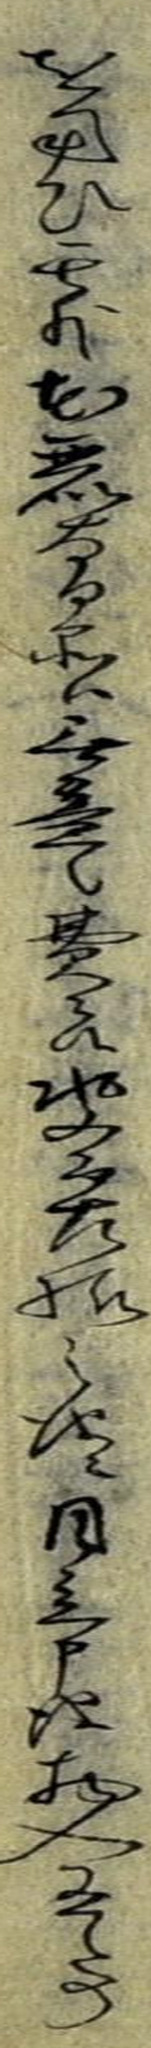を用ひ其外花麗なる品ハ無益之費ニ候決而左様之儀ニ目立申儀物入有之事

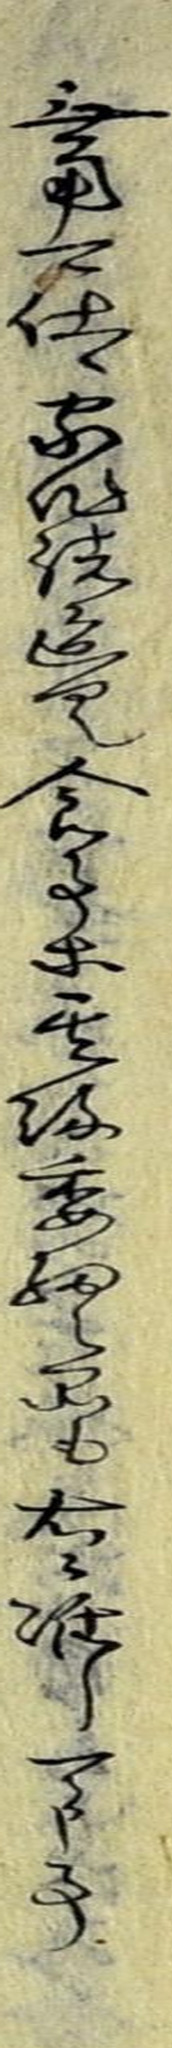無用可仕候家作諸道具食事等其余委細之品も右ニ准し可申事
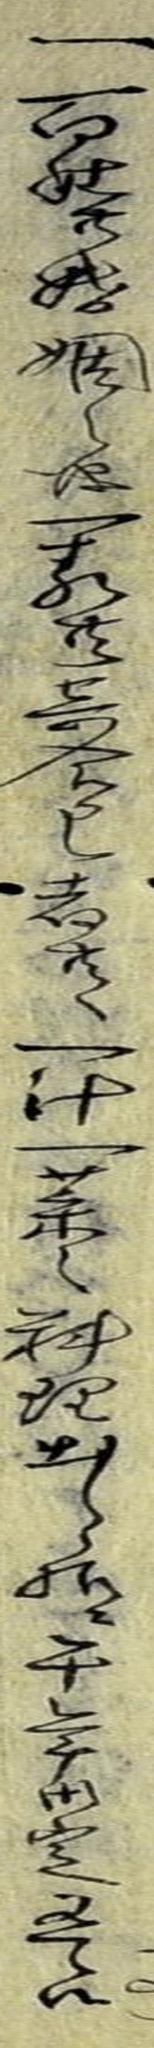一百姓共婚姻之儀一類共寄合申候者共へ一汁一菜之料理出し候様ニ午年御定有之候
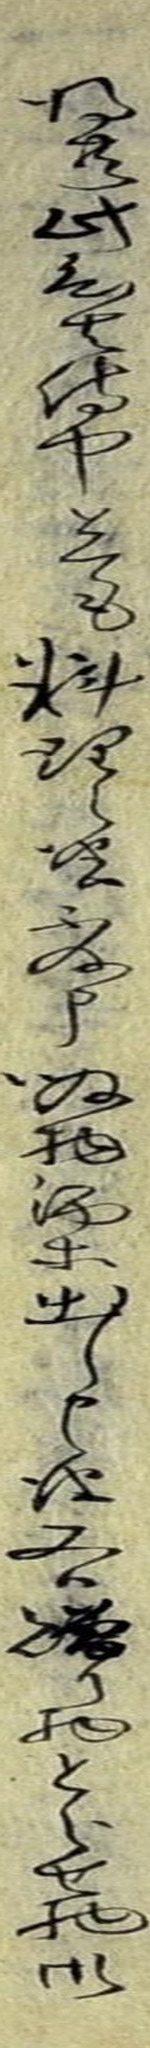得共此度者侍中とても料理之儀ハ不及申吸物酒等出し申儀又ハ贈り物とらせ物御
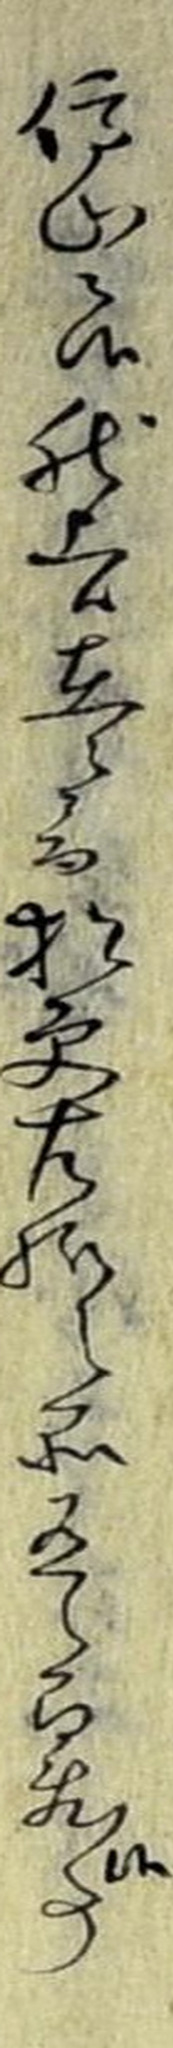停止ニ候然上ハ在々ニ而猶更左様之品有之間敷候事
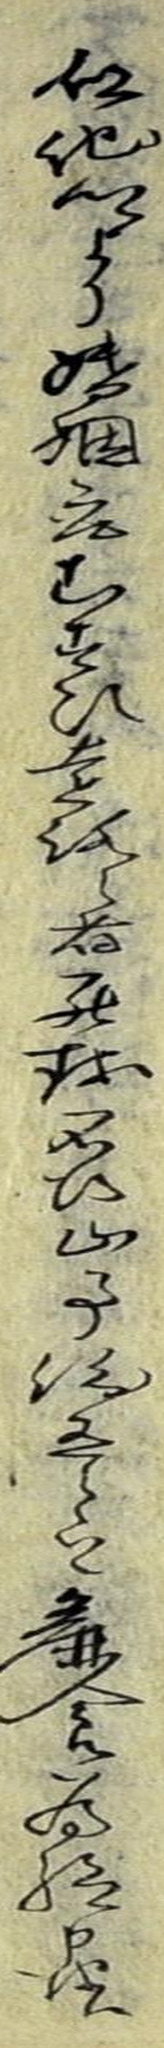但他郷より婚姻取むすひ遠路之者罷越不得止事儀有之候ハヽ麁食為給申儀ハ
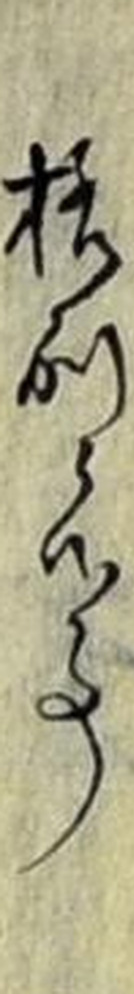格別ニ候事
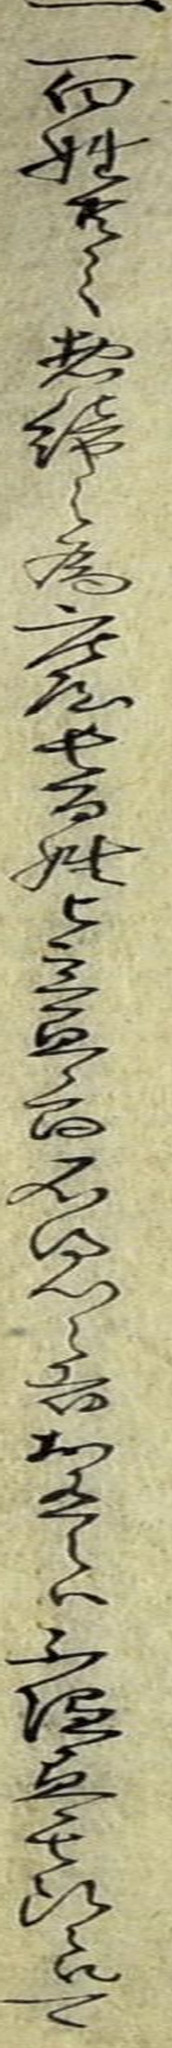一百姓共之惣締之為庄屋長百姓被立置候間不得心之者於有之ハ不隠置其頭々江可
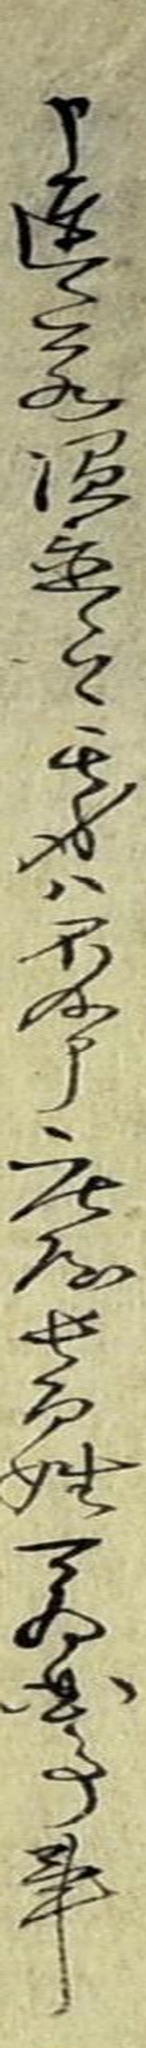申達候若隠置候ハヽ其身ハ不及申庄屋長百姓可為曲事事
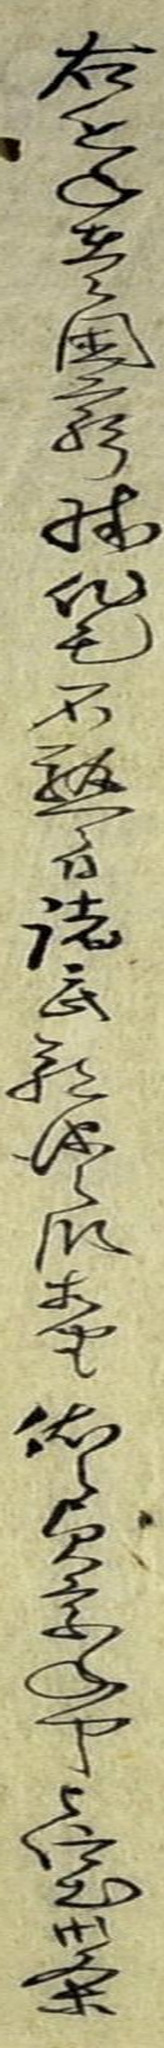右近年在々困窮殊作毛不熟ニ付諸民難儀之段相聞候依之貞享年中被仰出御条
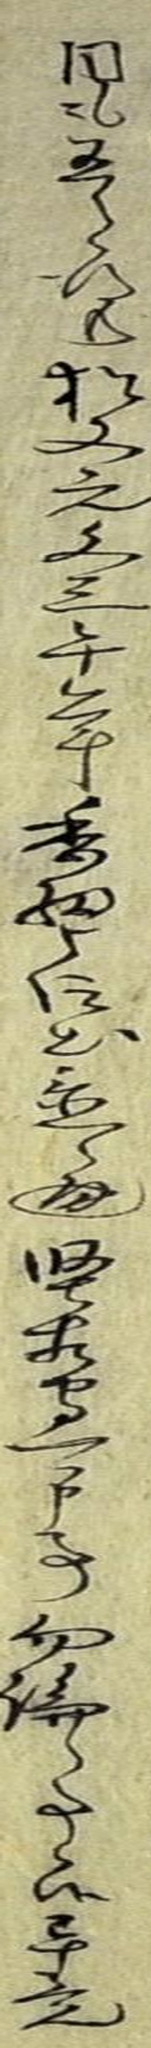目も有之候得共猶又元文三午年委細被仰出置候通堅相守可申事勿論之事ニ候畢竟
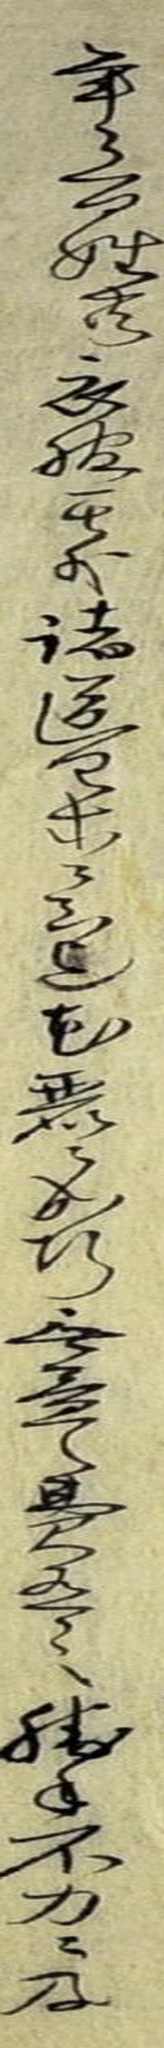年々百姓共衣服其外諸道具等ニ至迄花麗ニ成行無益之費有之勝手不力ニ及
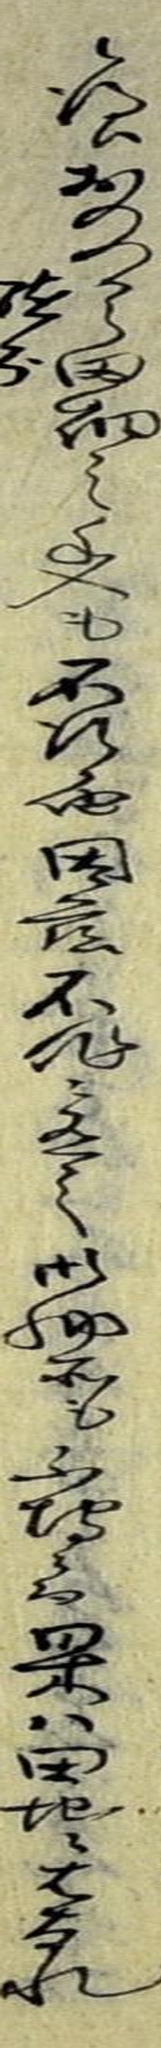候得ハおのつから田畑之手入も不行届因茲不作ニ有之御納所も不埒ニ而果ハ田地ニはなれ
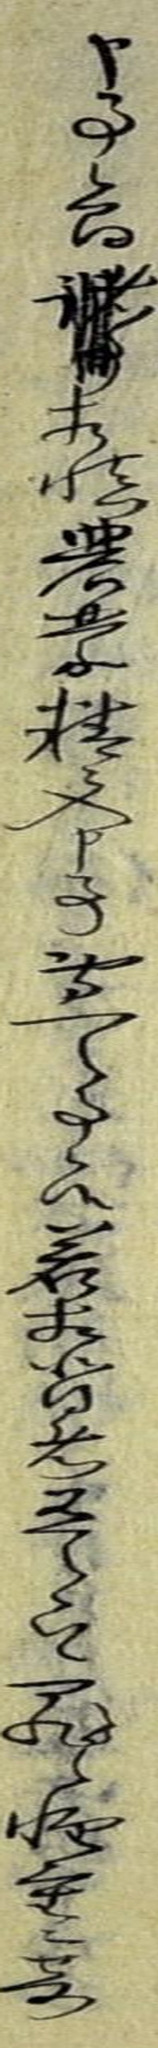申事候間随分相慎農業精ニ入申事専一之事ニ候若相背者有之候ハヽ罪之軽重ニ寄
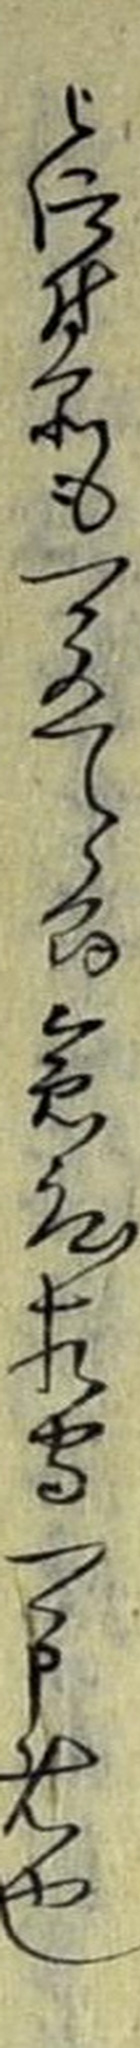被仰付品も可有之候間急度相守可申者也
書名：命令之部 一
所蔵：福井県文書館 Fukui Prefectural Archives
